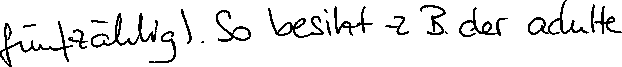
fünfzählig). So besitzt z. B. der adulte
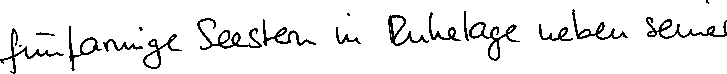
fünfarmige Seestern in Ruhelage neben seiner
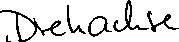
Drehachse
